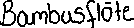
Bambusflöte
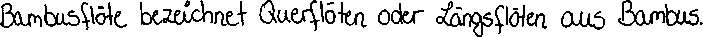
Bambusflöte bezeichnet Querflöten oder Längsflöten aus Bambus.
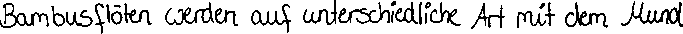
Bambusflöten werden auf unterschiedliche Art mit dem Mund
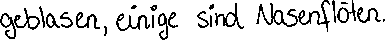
geblasen, einige sind Nasenflöten.
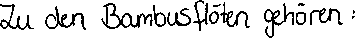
Zu den Bambusflöten gehören:
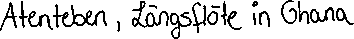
Atenteben, Längsflöte in Ghana
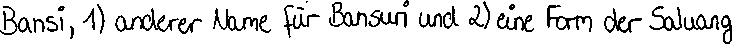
Bansi, 1) anderer Name für Bansuri und 2) eine Form der Saluang
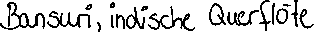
Bansuri, indische Querflöte
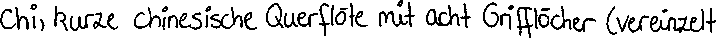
Chi, kurze chinesische Querflöte mit acht Grifflöcher (vereinzelt
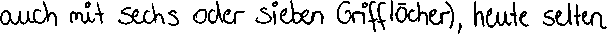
auch mit sechs oder sieben Grifflöcher), heute selten
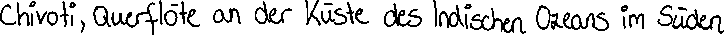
Chivoti, Querflöte an der Küste des Indischen Ozeans im Süden
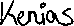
Kenias
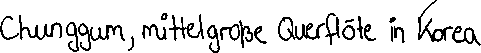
Chunggum, mittelgroße Querflöte in Korea
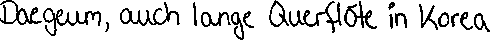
Daegeum, auch lange Querflöte in Korea
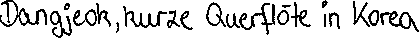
Dangjeok, kurze Querflöte in Korea
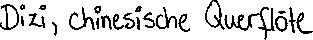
Dizi, chinesische Querflöte
